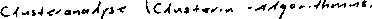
Clusteranalyse (Clustering-Algorithmus,
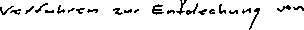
Verfahren zur Entdeckung von
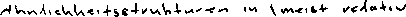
Ähnlichkeitsstrukturen in (meist relativ
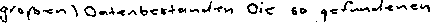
großen) Datenbeständen. Die so gefundenen
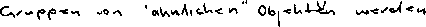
Gruppen von "ähnlichen" Objekten werden
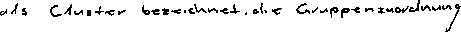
als Cluster bezeichnet, die Gruppenzuordnung
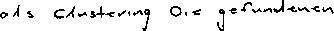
als Clustering. Die gefundenen
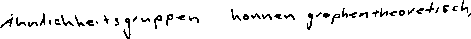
Ähnlichkeitsgruppen können graphentheoretisch,
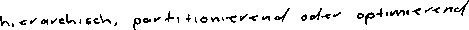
hierarchisch, partitionierend oder optimierend
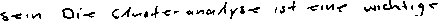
sein. Die Clusteranalyse ist eine wichtige
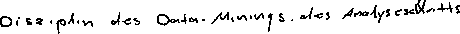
Disziplin des Data-Minings, des Analyseschritts
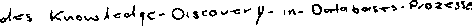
des Knowledge-Discovery-in-Databases-Prozesses.
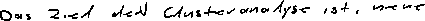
Das Ziel der Clusteranalyse ist, neue
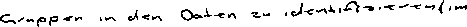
Gruppen in den Daten zu identifizieren (im
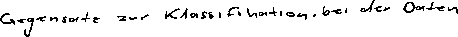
Gegensatz zur Klassifikation, bei der Daten
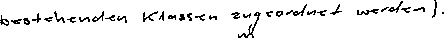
bestehenden Klassen zugeordnet werden).
